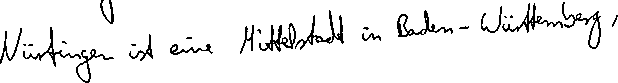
Nürtingen ist eine Mittelstadt in Baden-Württemberg,
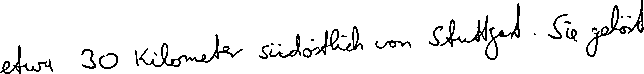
etwa 30 Kilometer südöstlich von Stuttgart. Sie gehört
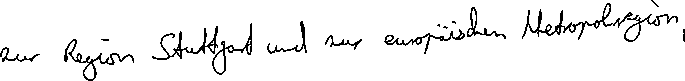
zur Region Stuttgart und zur europäischen Metropolregion
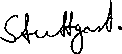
Stuttgart.
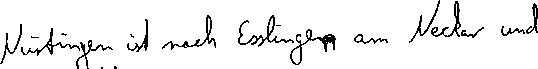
Nürtingen ist nach Esslingen am Neckar und
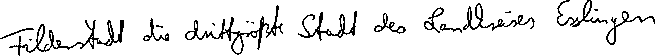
Filderstadt die drittgrößte Stadt des Landkreises Esslingen
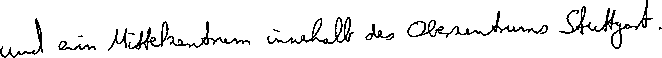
Und ein Mittelzentrum innerhalb des Oberzentrums Stuttgart.
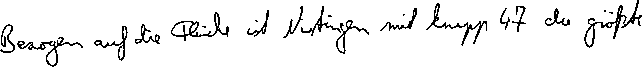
Bezogen auf die Fläche ist Nürtingen mit knapp 47 die größte
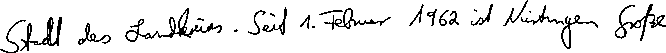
Stadt des Landkreises. Seit 1. Februar 1962 ist Nürtingen Große
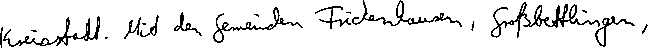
Kreisstadt. Mit den Gemeinden Frickenhausen, Großbettlingen,
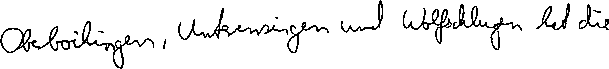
Oberboihingen, Unterensingen und Wolfschlugen hat die
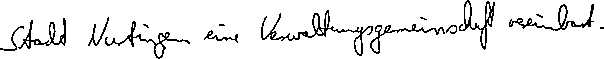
Stadt Nürtingen eine Verwaltungsgemeinschaft vereinbart.
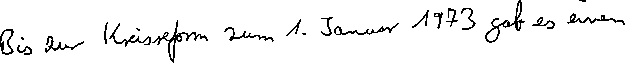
Bis zur Kreisreform zum 1. Januar 1973 gab es einen
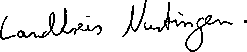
Landkreis Nürtingen.
